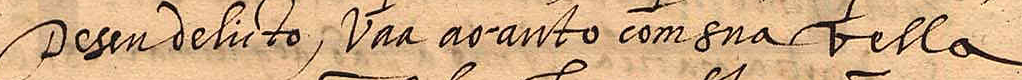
De seu delicto, vaa ao auto com sua vella
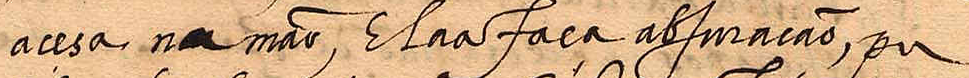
acesa na mão, E Laa faça abJuração, pu
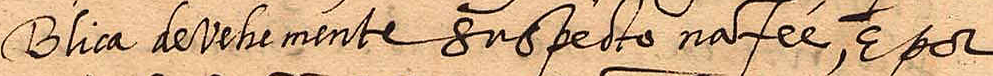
Blica de vehemente suspecto na fee, E por
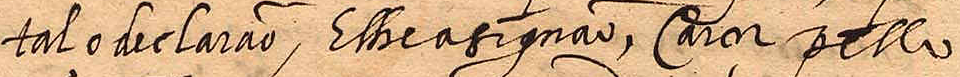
tal o declarão, E lhe asignão, Carçer pello
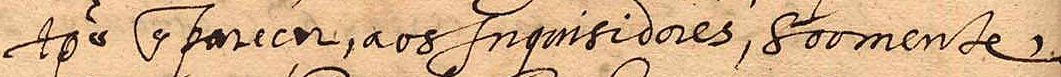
tpo̅ q̅ pareçer, aos Jnquisidores, soomente,
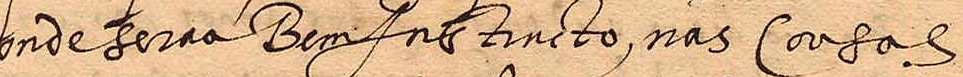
onde seraa Bem Jnstructo, nas Cousas
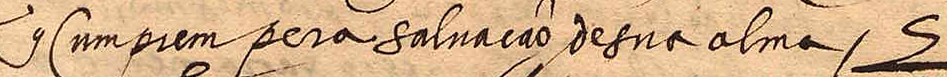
q̅ Cumprem pera saluação de sua alma / E
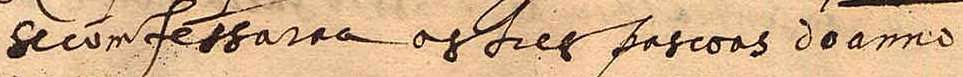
se comfessaraa as tres pascoas do anno
